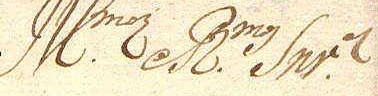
Ill.moz e R.mos Snr.es
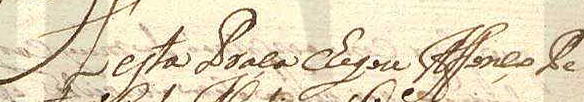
A esta Praça chegou Affonço Pe
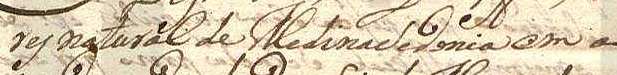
res natural de Medina Sedonia em a
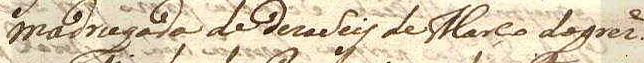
madrugada de dezaseis de Março do prez.te
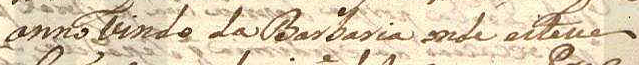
anno vindo da Barbaria onde esteue
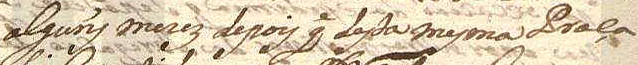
algun̄s mezez depois q̄ desta mesma Praça
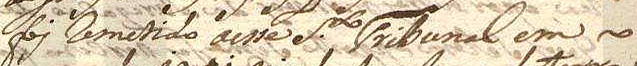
foj Remetido a esse S.to Tribunal em o
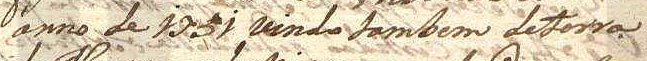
anno de i75i vindo tambem de terra
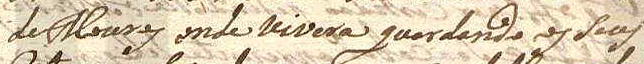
de Mouros onde vivera guardando os seus
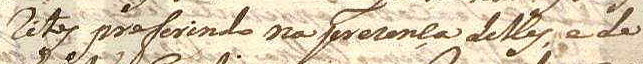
Ritos proferindo na prezença delles, e de
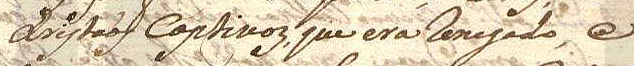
christaõs Captivoz, que era Renegado, e
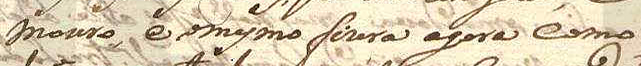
mouro, e o mesmo fizera agora como
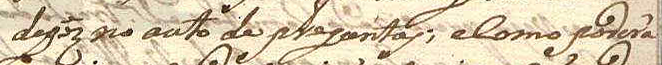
depôz no auto de preguntas; e Como poderá
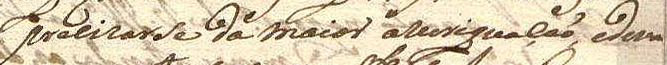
precizarse da maior averiguaçaõ, e deva
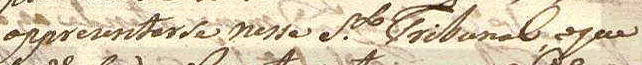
apprezentarse nesse S.to Tribunal, o que
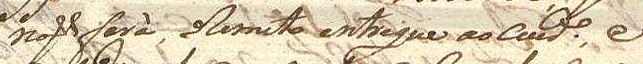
naõ farà, o Remeto entregue ao cuid.o, e
